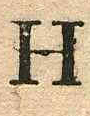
H
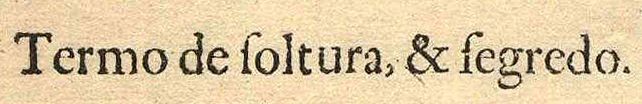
Termo de soltura, & segredo.
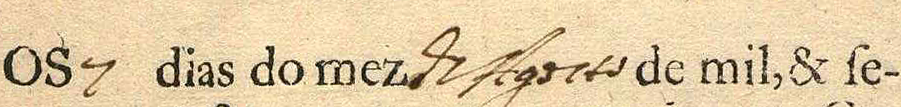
OS 7 dias do mez de Agosto de mil, & se
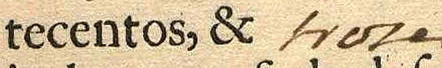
tecentos, & treze
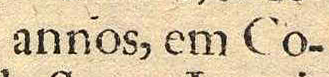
annos, em Co
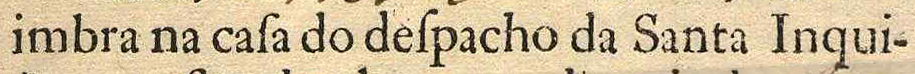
imbra na casa do despacho da Santa Inqui
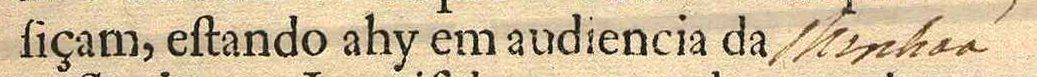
siçam, estando ahy em audiencia da Menhaã
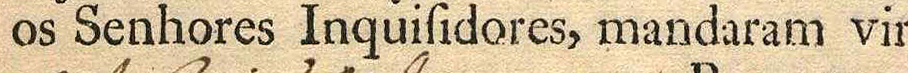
os Senhores Inquisidores, mandaram vir
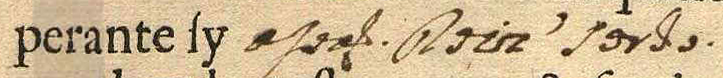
perante sy a Joaõ Roiz̄ sordo.
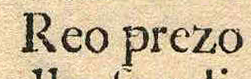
Reo prezo
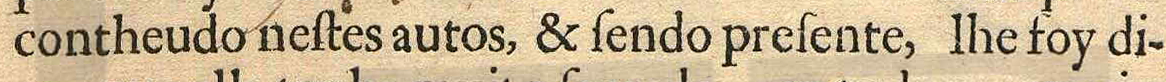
contheudo nestes autos, & sendo presente, lhe foy di
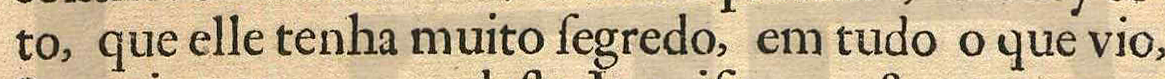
to, que elle tenha muito segredo, em tudo o que vio,
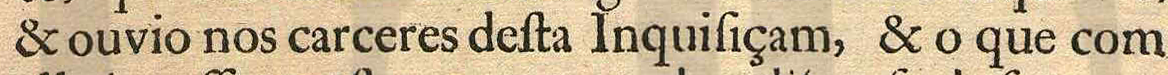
& ouvio nos carceres desta Inquisiçam, & o que com
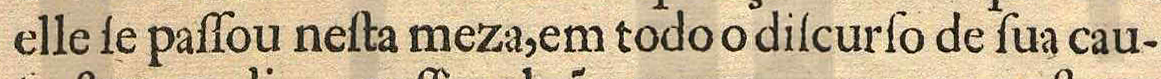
elle se passou nesta meza, em todo o discurso de sua cau
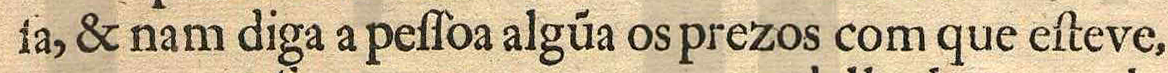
sa, & nam diga a pessoa algūa os prezos com que esteve,
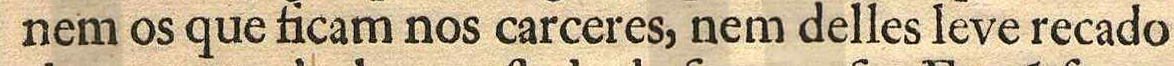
nem os que ficam nos carceres, nem delles leve recado
